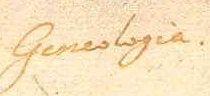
Geneologia.
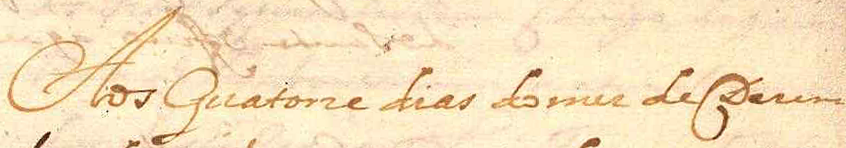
Aos Quatorze dias do mez de Dezem
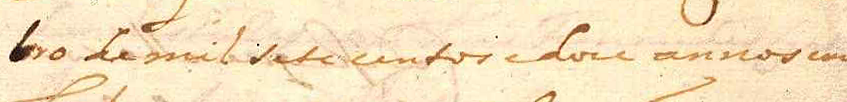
bro de mil setecentos e doze annos em
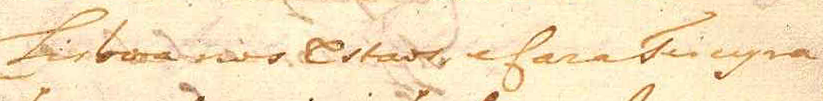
Lisboa nos Estaos, e Caza Terceyra
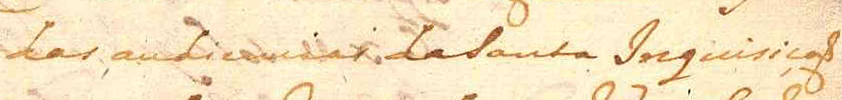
das audiemcias da Santa Inquisiçaõ
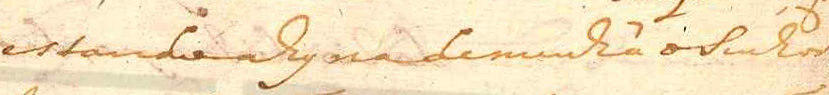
estando ahy na de menhã o Senhor
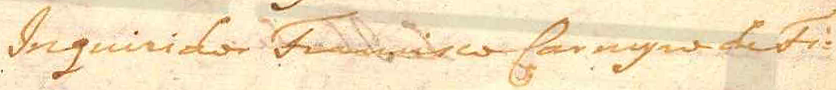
Inquizidor Francisco Carneyro de Fi
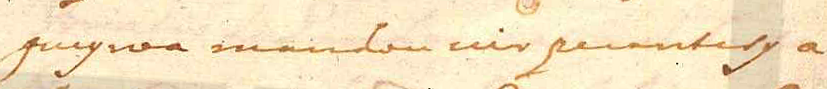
gueyroa mandou uir perante sy a
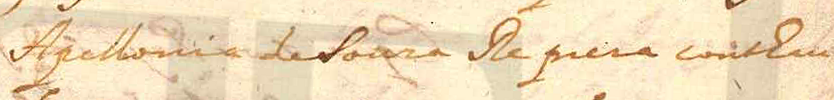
Apellonia de Souza Re preza contheu
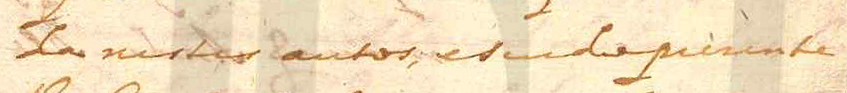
da nestes autos, e sendo prezente
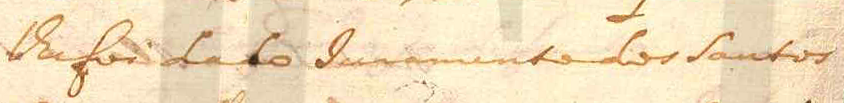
lhe foi dado Iuramento dos santos
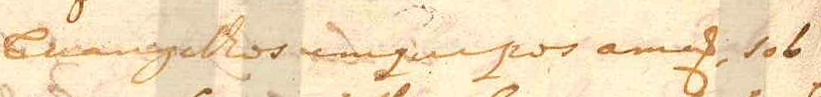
Euangelhos em que pos a maõ, sob
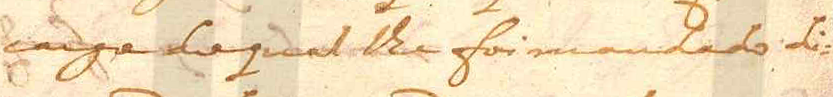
cargo do qual lhe foi mandado di
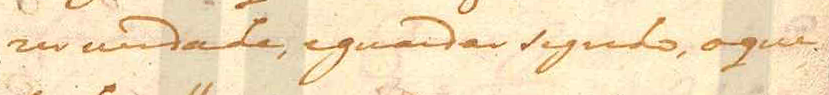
zer uerdade, e guardar segredo, o que
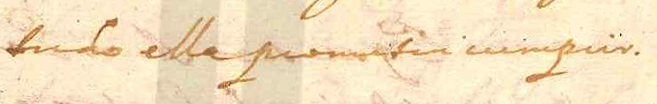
tudo elle prometeu cumprir.
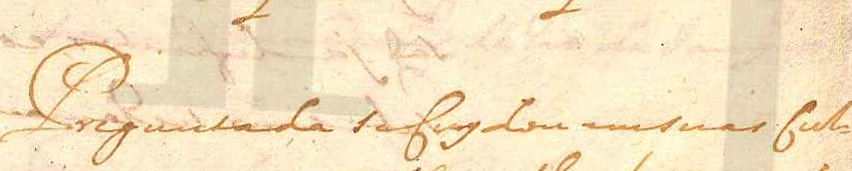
Preguntada se Cuydou em suas Cul
